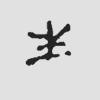生
